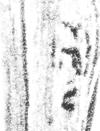○（集）
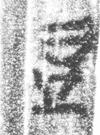○（廚）
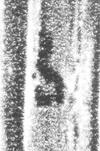之
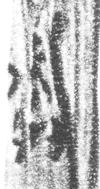器
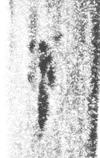十
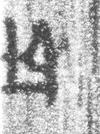○（瓶）
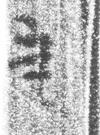屯
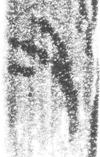又（有）
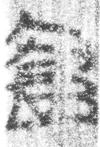盍（蓋）
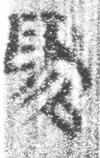緅
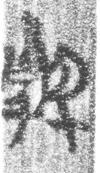與
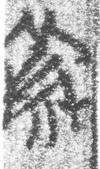索（素）
